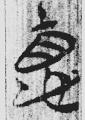惪（德）
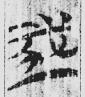城（成）
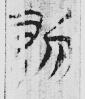則
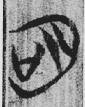名
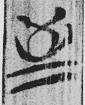至
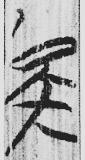矣
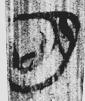名
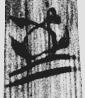至
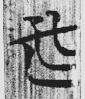必
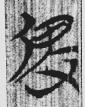俾（卑）
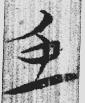身
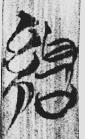○（治）
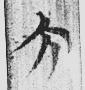大
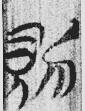則〈則大〉
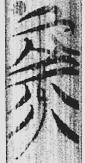彔（祿）
